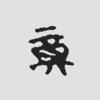奠
